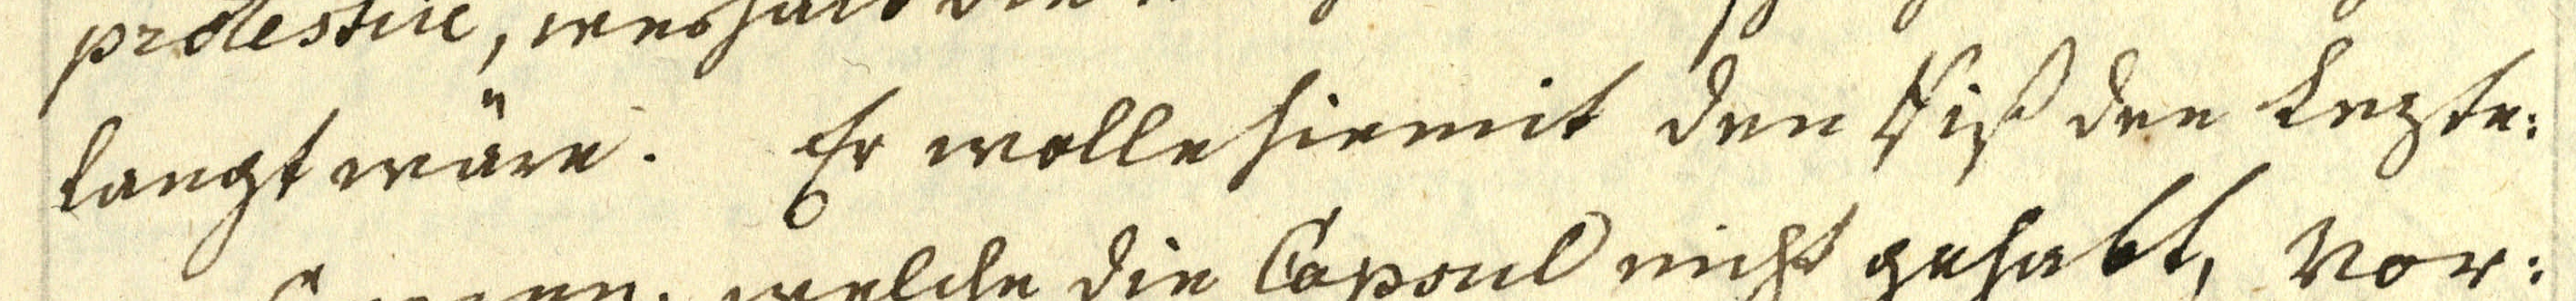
langt wäre. Er wolle hiemit den Riß den lezte¬
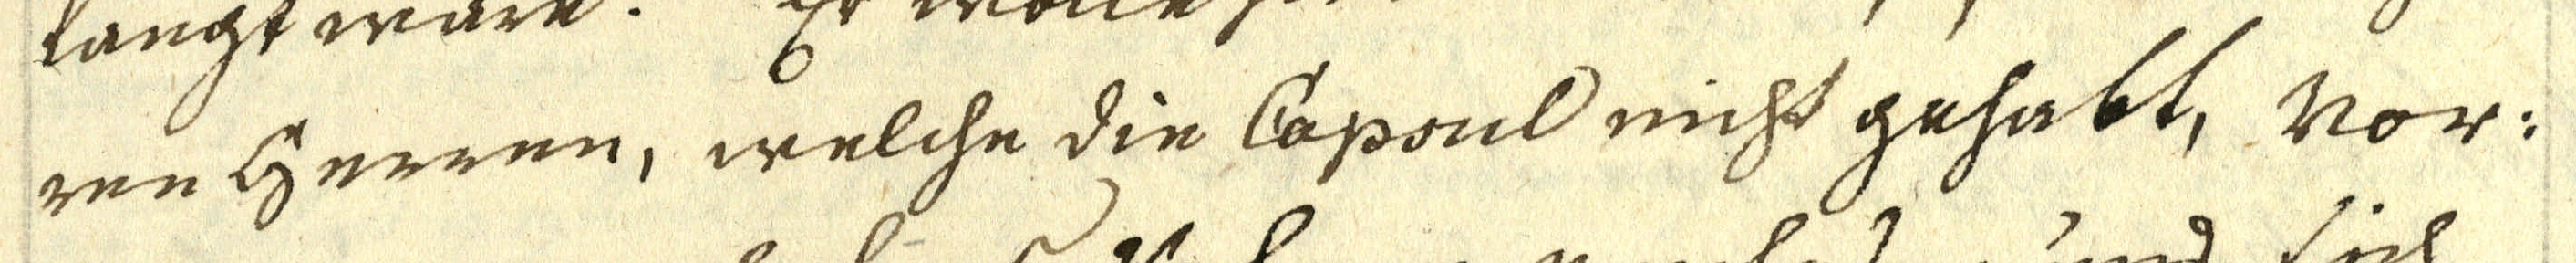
ren Herren, welche die Capsul nicht gehabt, vor¬
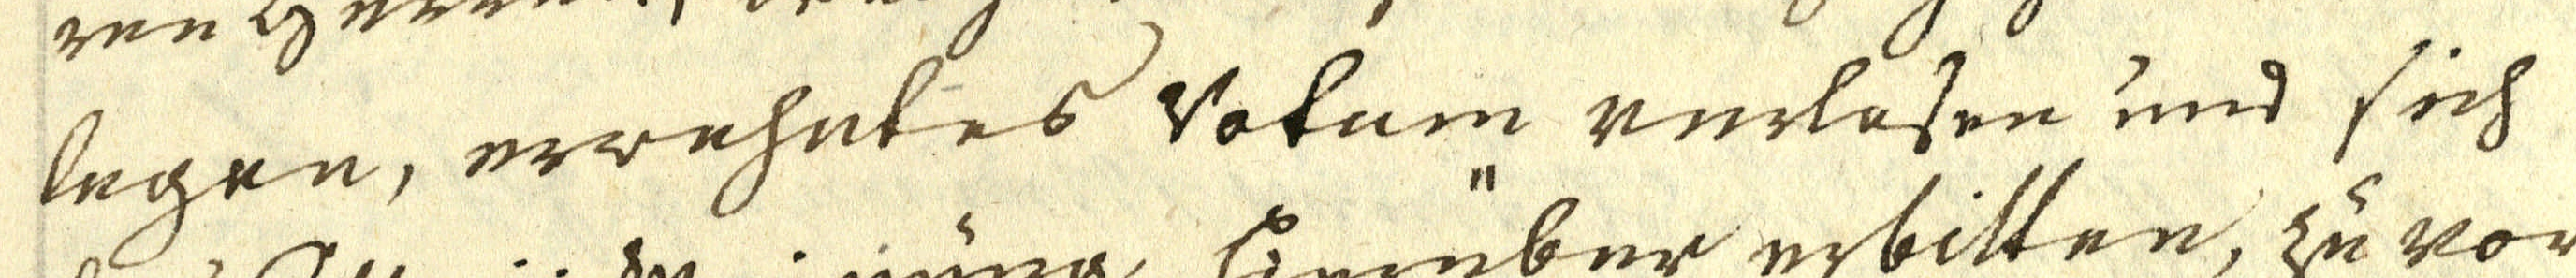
legen, erwehntes votum verlesen und sich
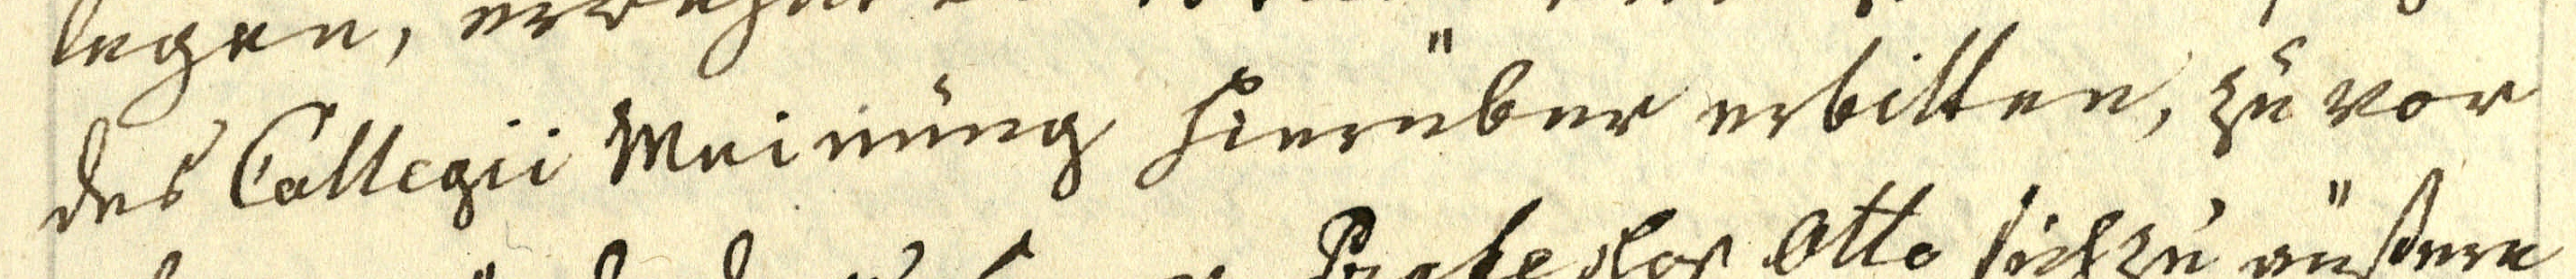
des Collegii Meinung hierüber erbitten, zu vor
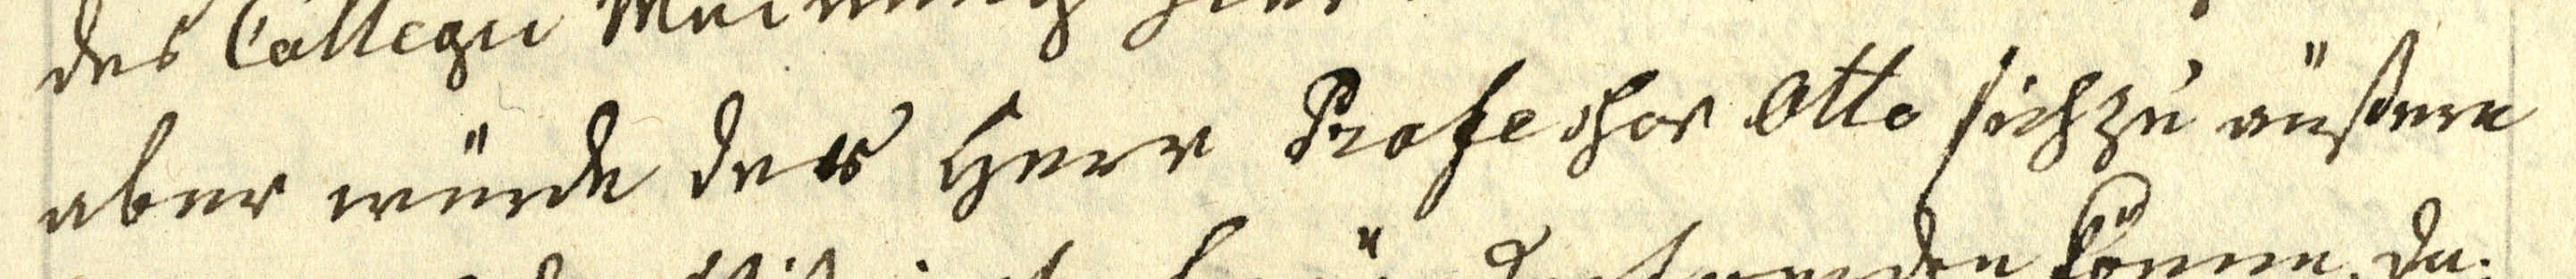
aber würde der Herr Professor Otto sich zu äußern
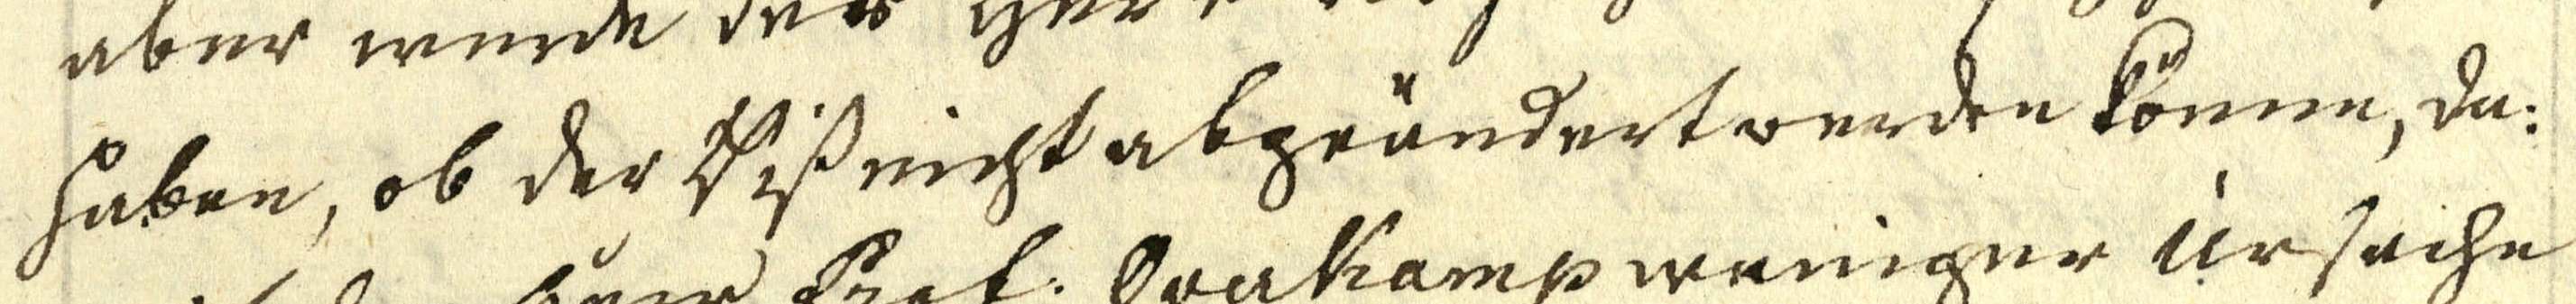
haben, ob der Riß nicht abgeändert werden könne, da¬
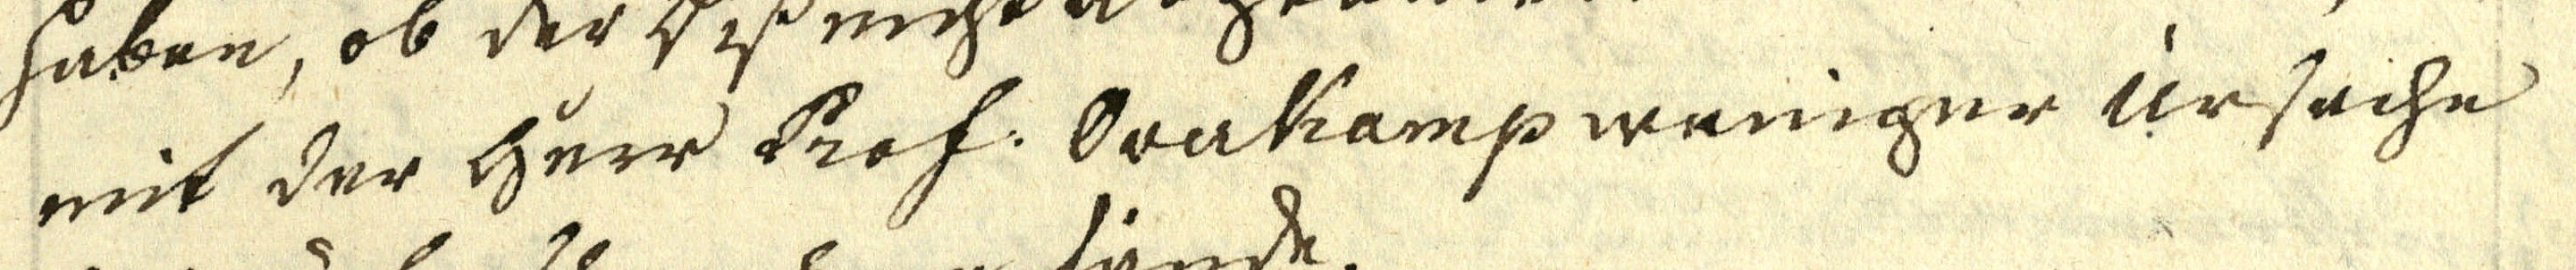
mit der Herr Prof. Overkamp weniger Ursache
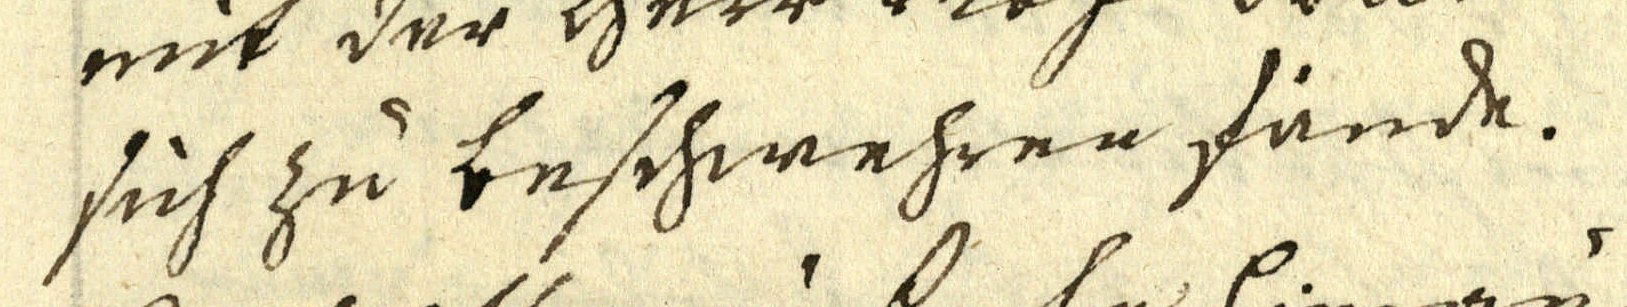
sich zu beschwehren fände.
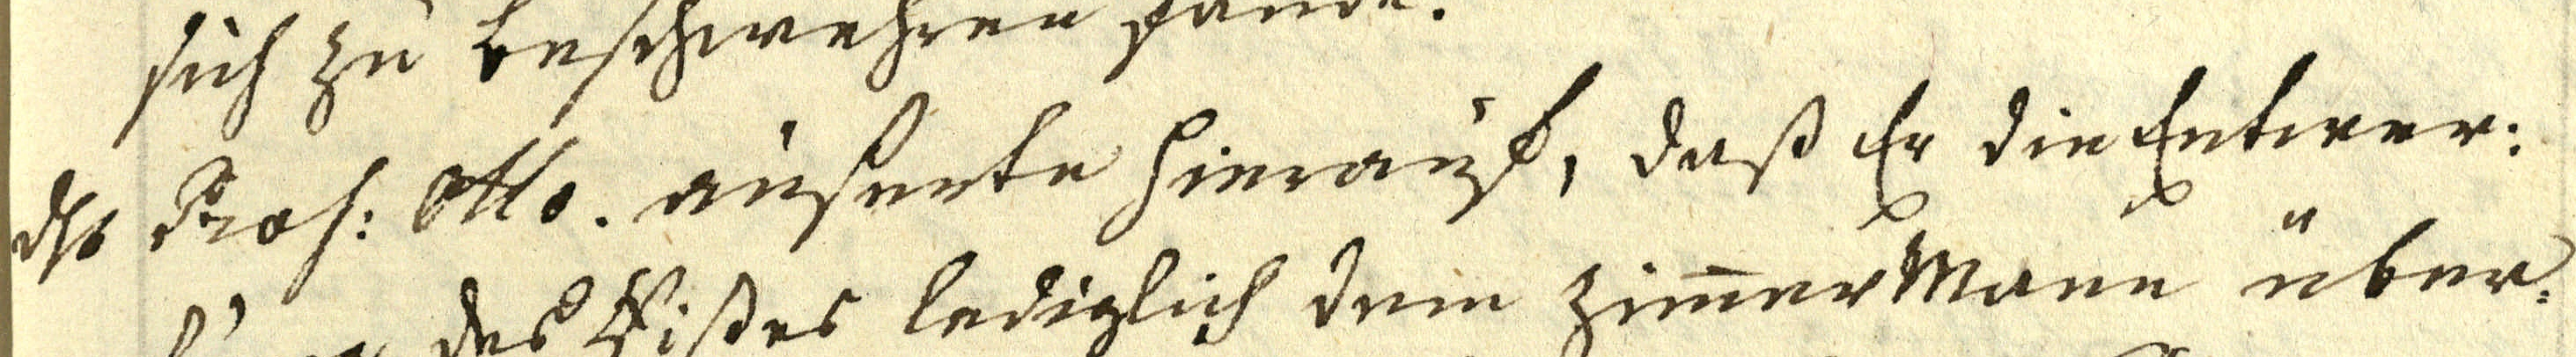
dh Prof. Otto. äußerte hierauf, daß Er die Entwer¬
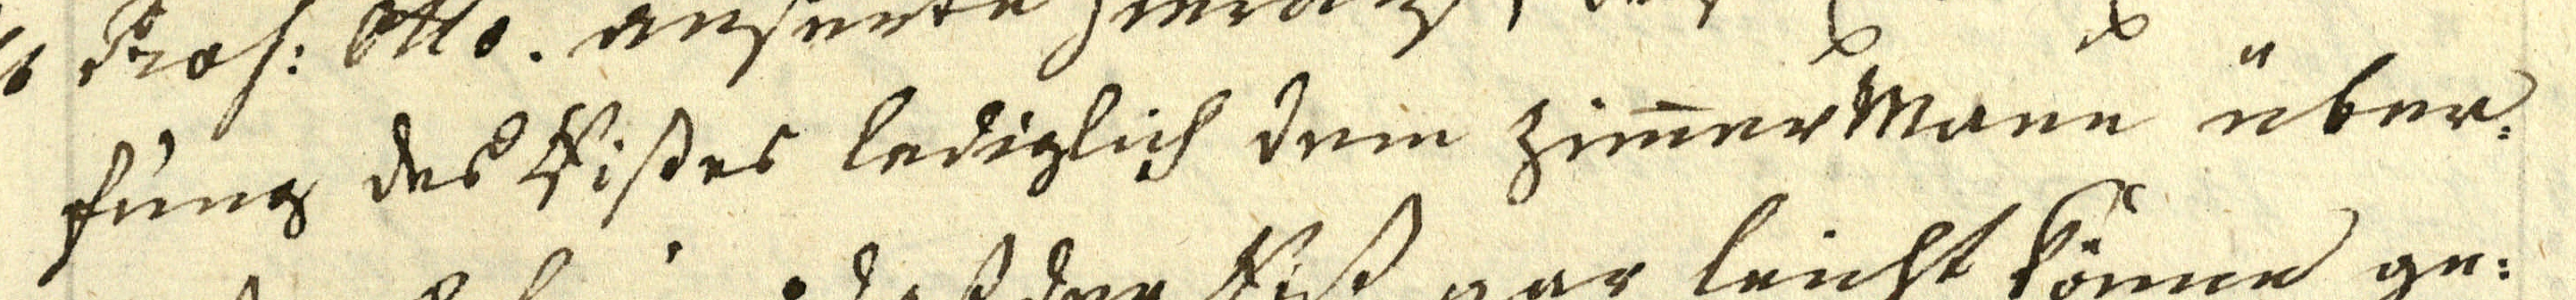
fung des Rißes lediglich dem Zimmer Mann über¬
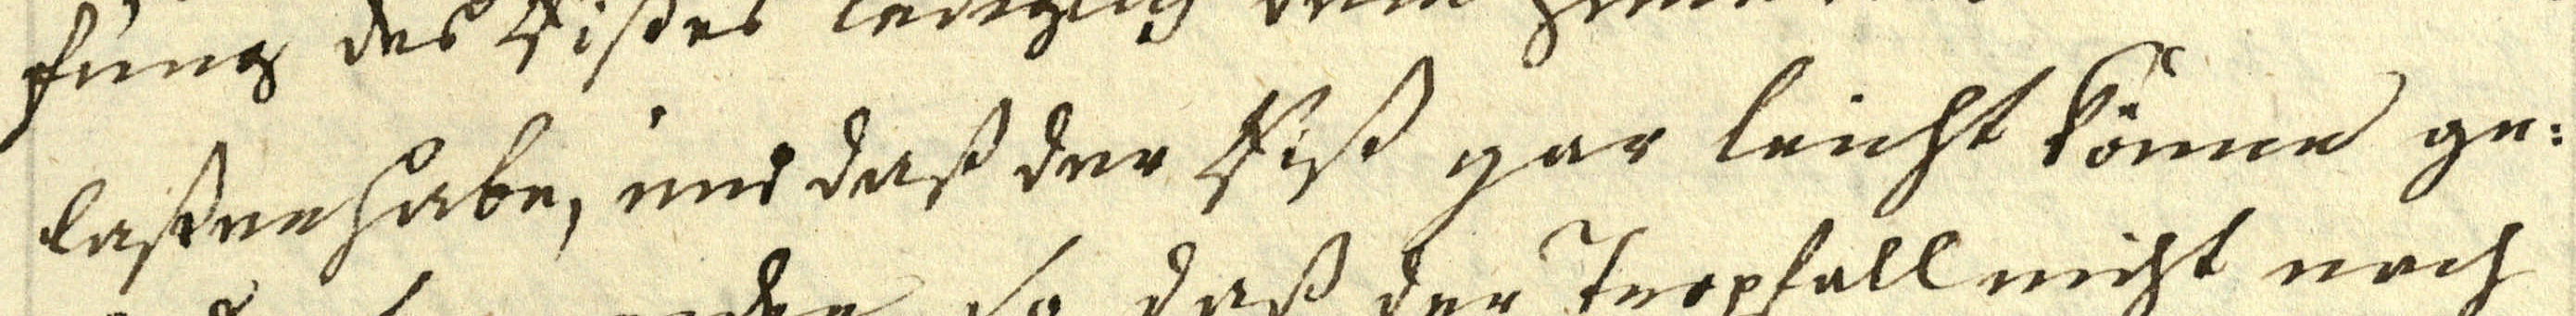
laßen habe, und daß der Riß gar leicht könne ge¬
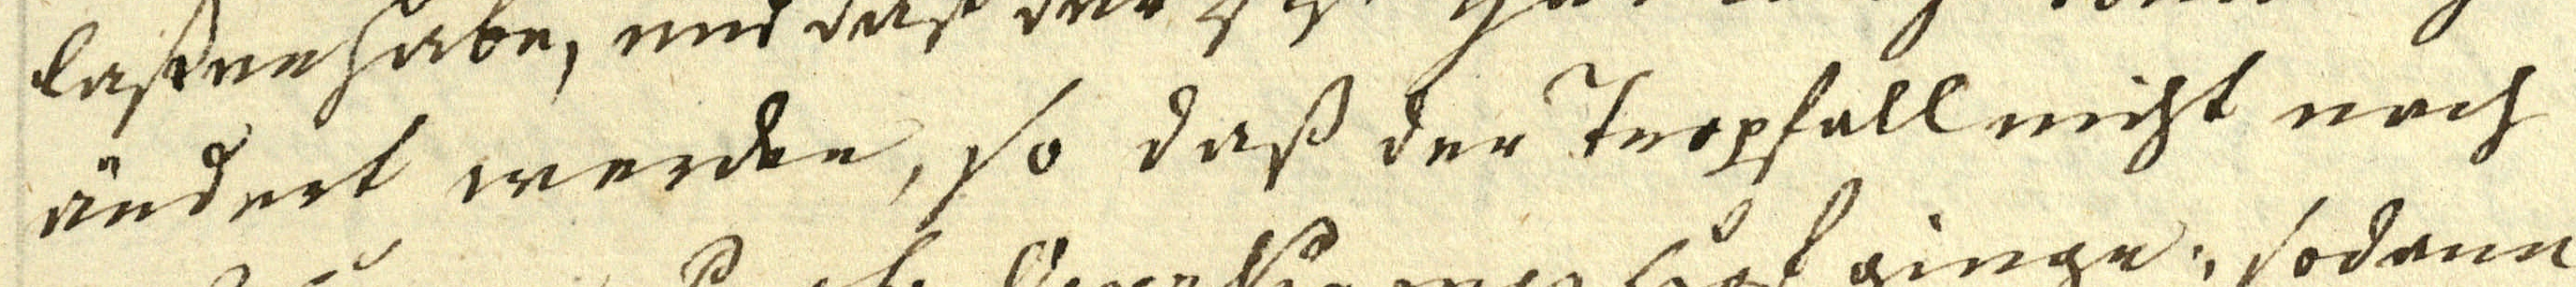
ändert werden, so daß der Tropfall nicht nach
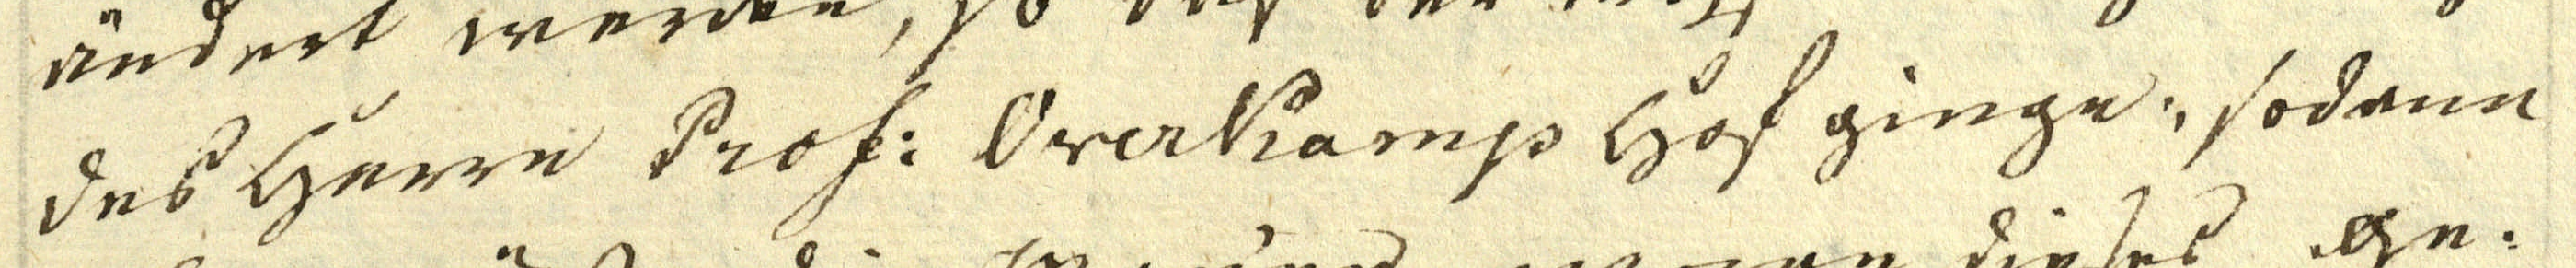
des Herrn Prof. Overkamp Hof ginge, sodann
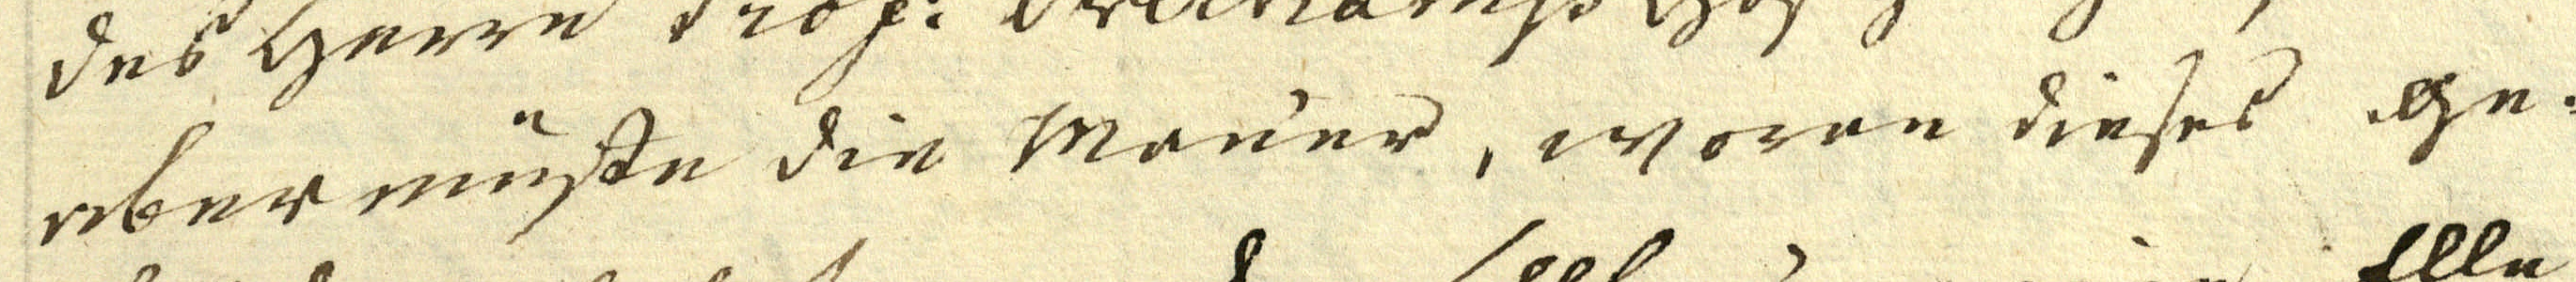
über müste die Mauer, woran dieses Ge¬
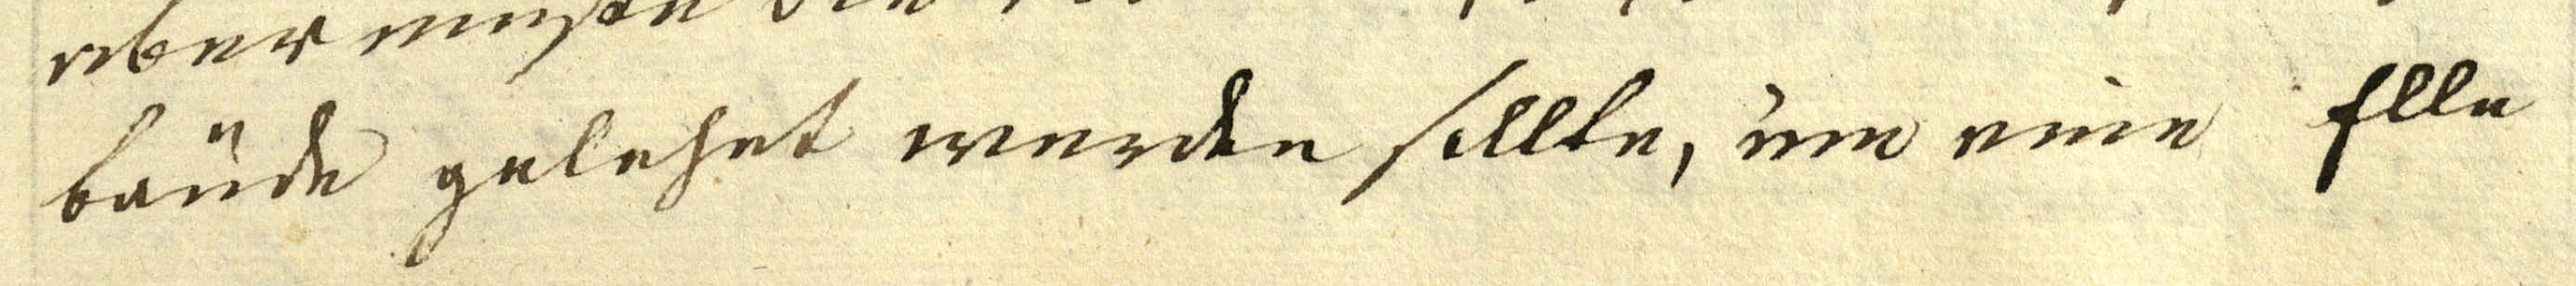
bäude gelehnt werden sollte, um eine Elle
